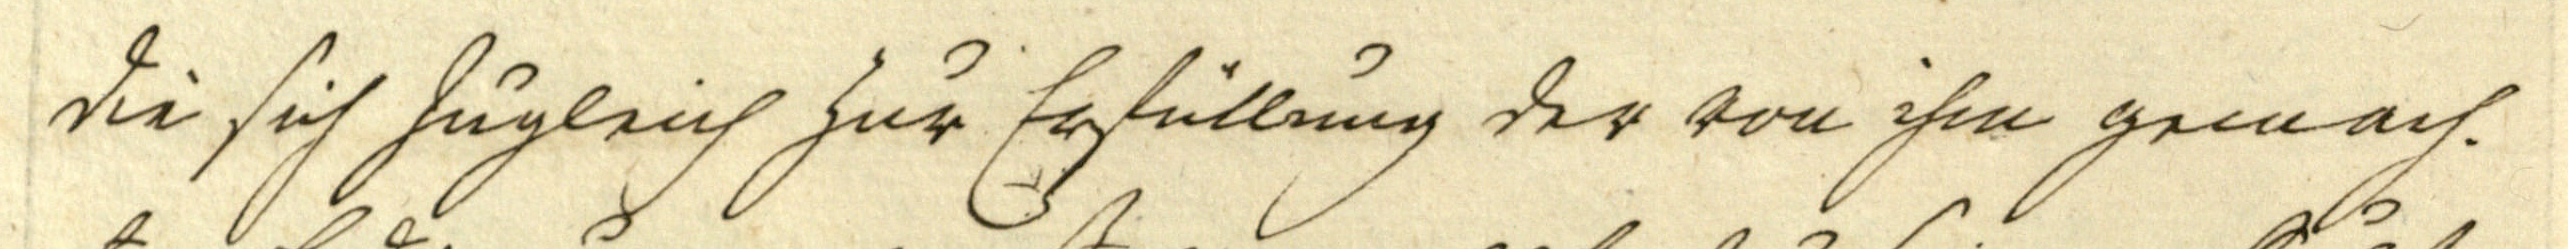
die sich zugleich zur Erfüllung der von ihm gemach¬
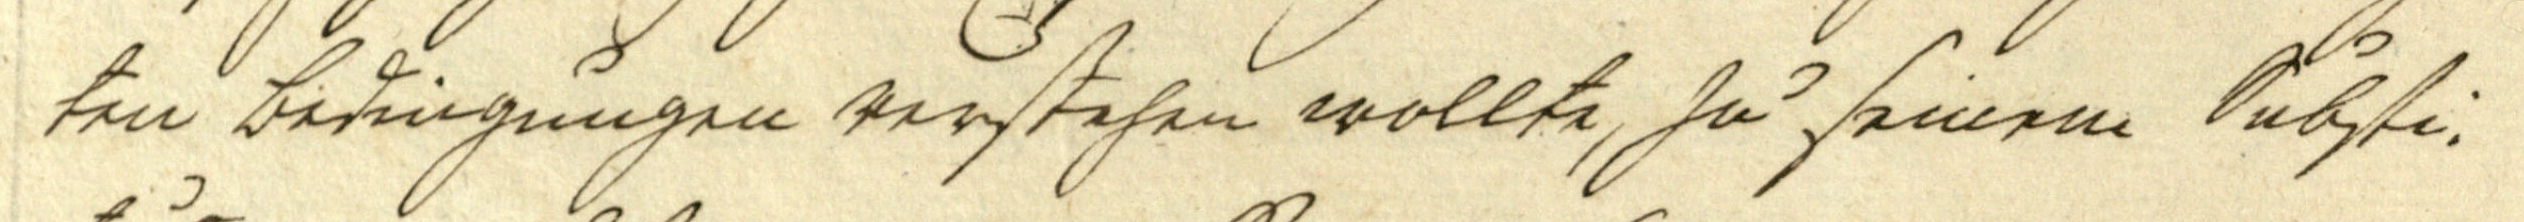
ten Bedingungen verstehen wollte, zu seinem Substi¬
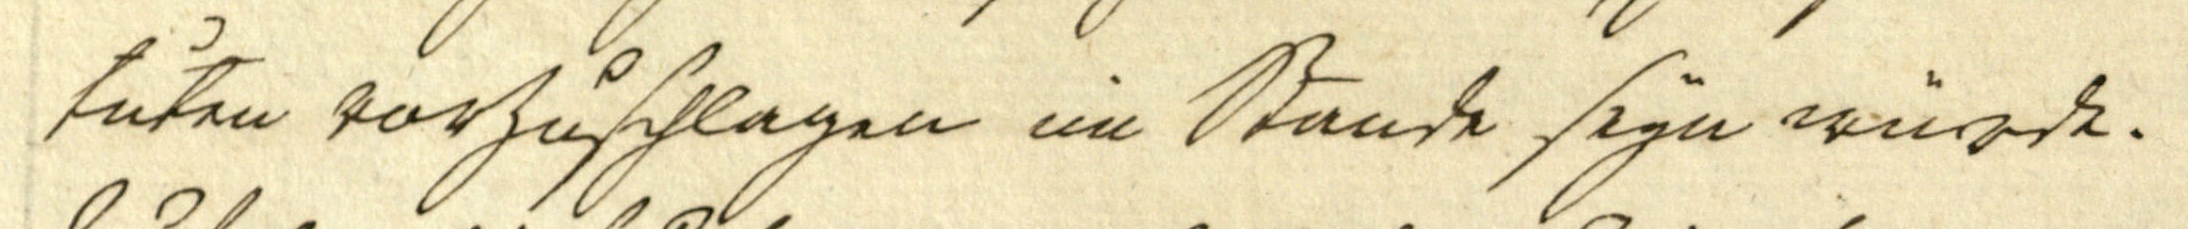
tuten vorzuschlagen im Stande seÿn würde.
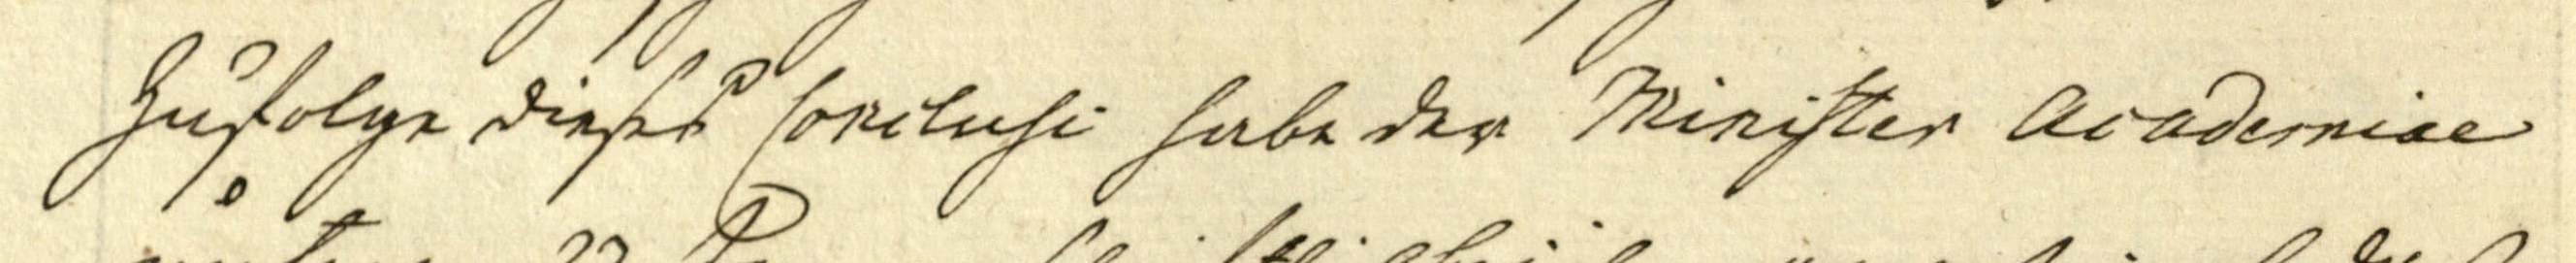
Zufolge dieses Conclusi habe der Minister Academiae
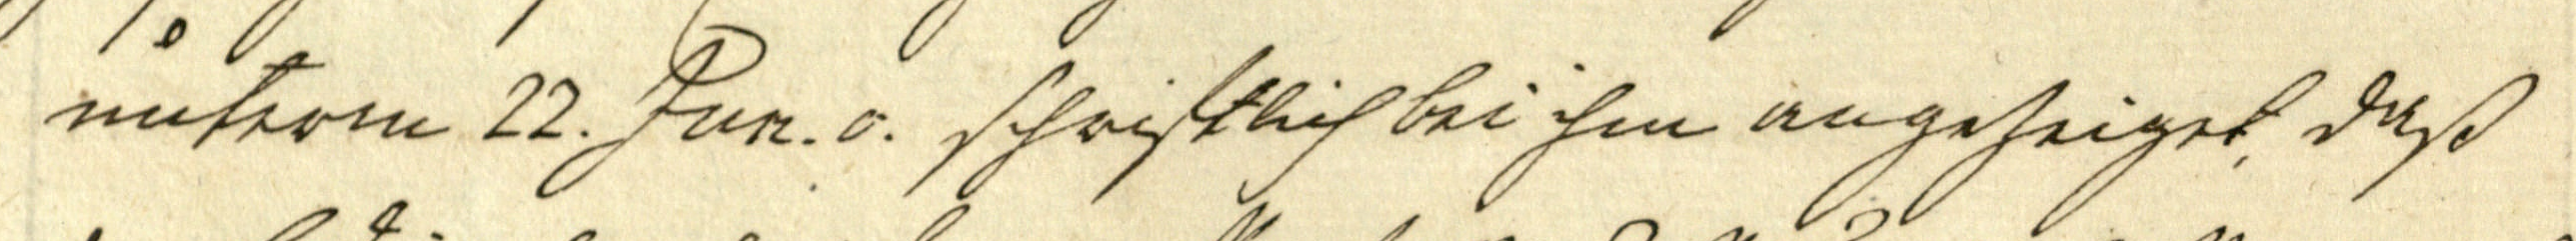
unterm 22. Jun. c. schriftlich bei ihm angezeiget, daß
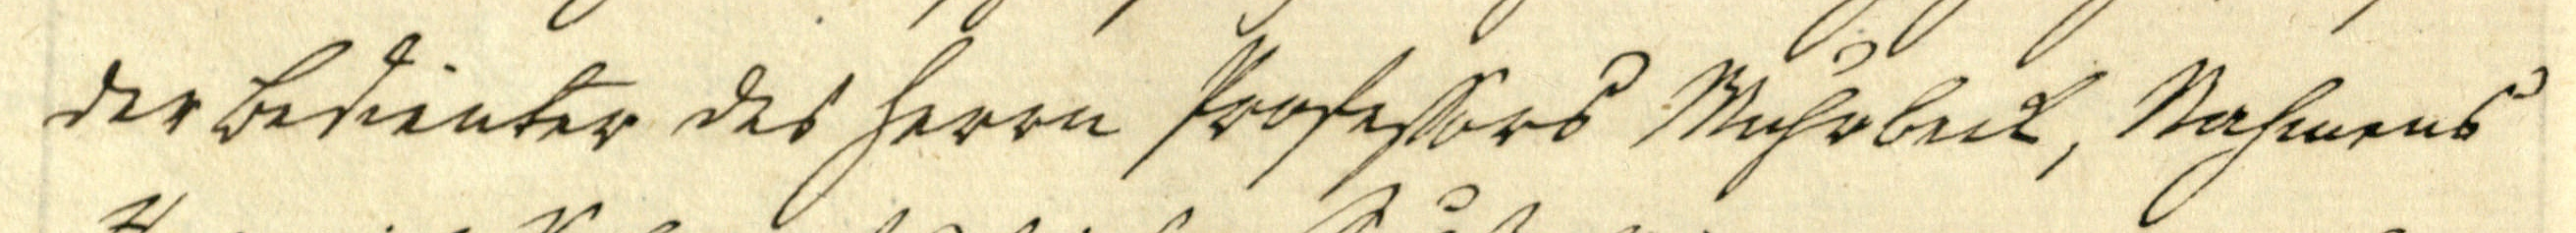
der Bedienter des herrn Professors Muhrbeck, Nahmens
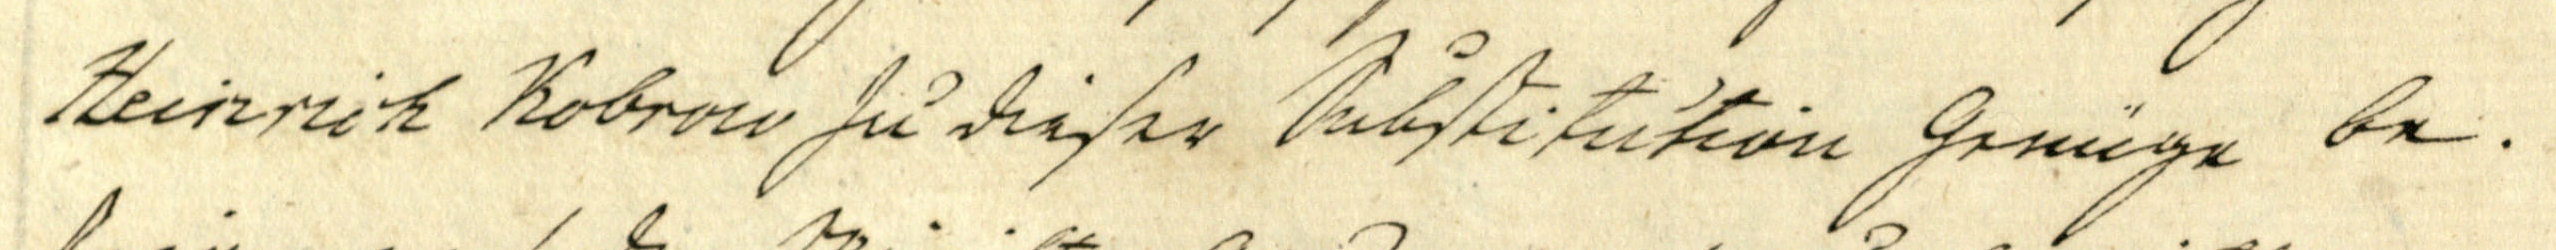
Heinrich Kobrow zu dieser Substitution Genüge be¬
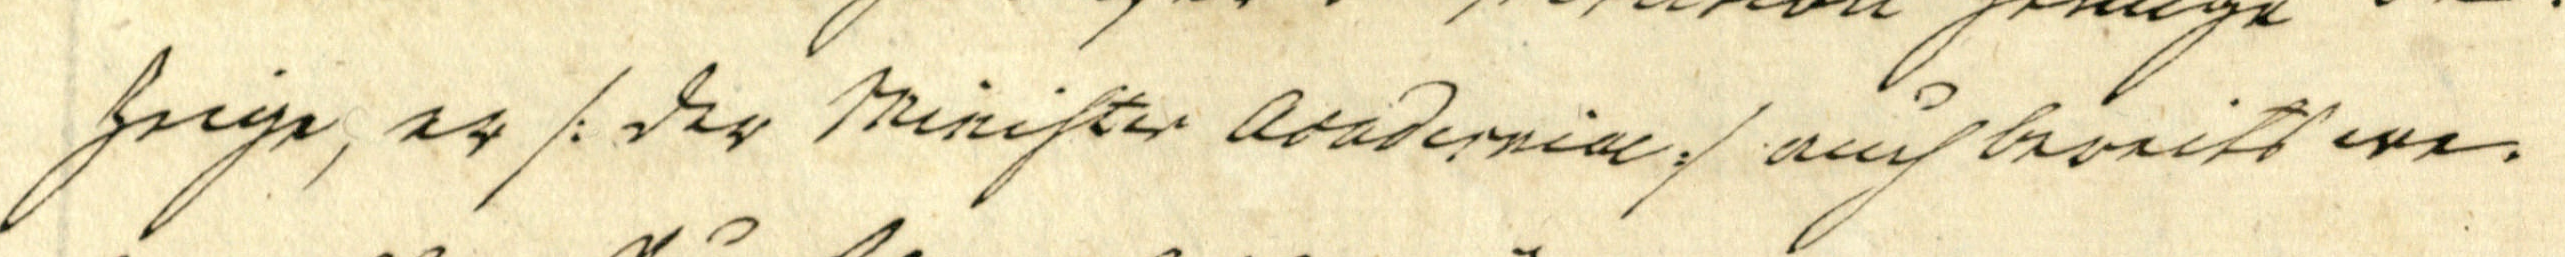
zeige, er / der Minister Academiae / auch bereits we¬
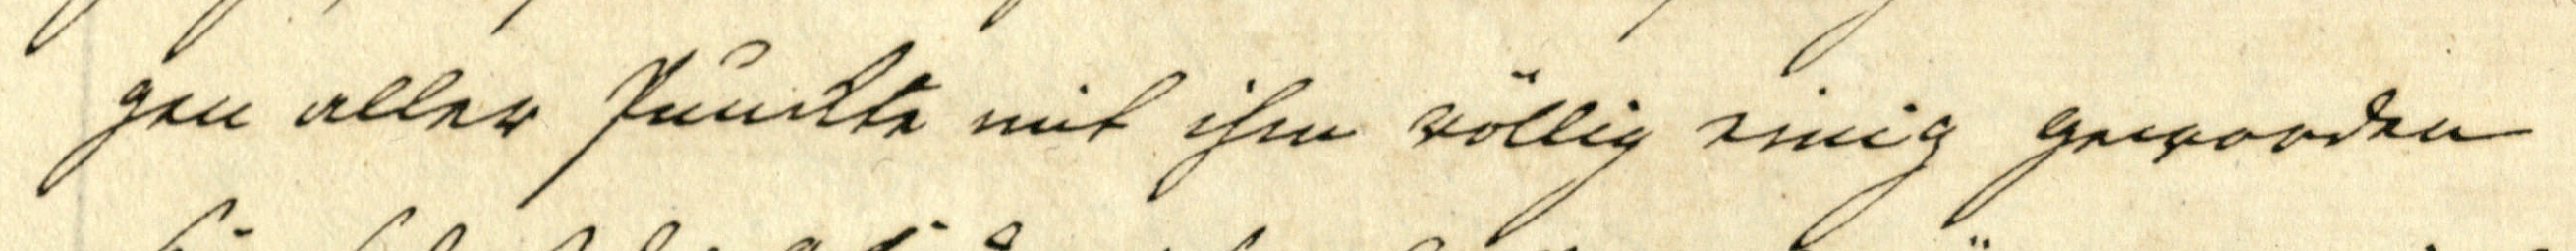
gen aller Punckte mit ihm völlig einig geworden
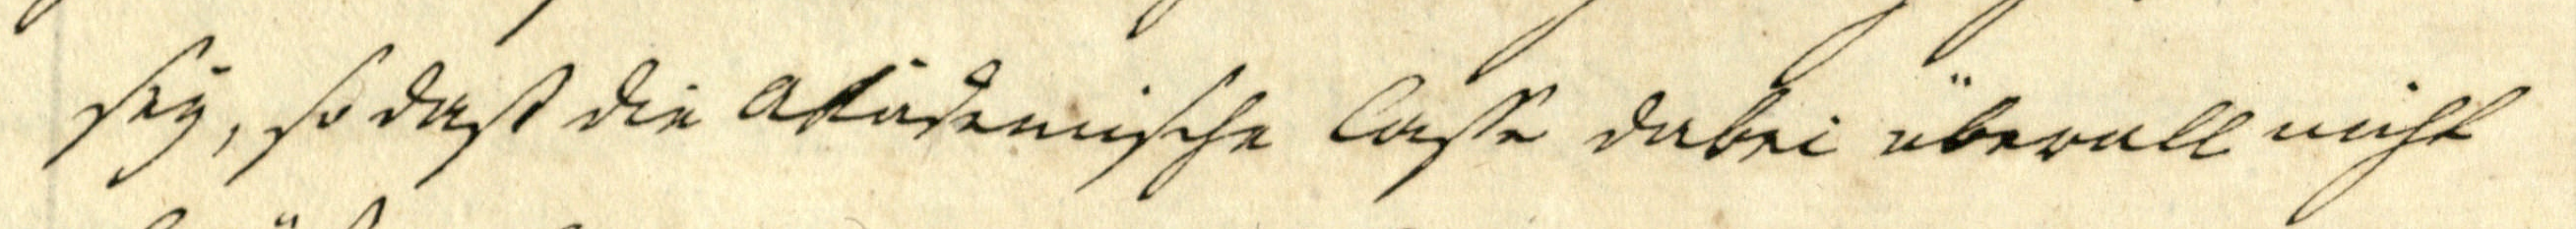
seÿ, so daß die akademische Casse dabei überall nicht
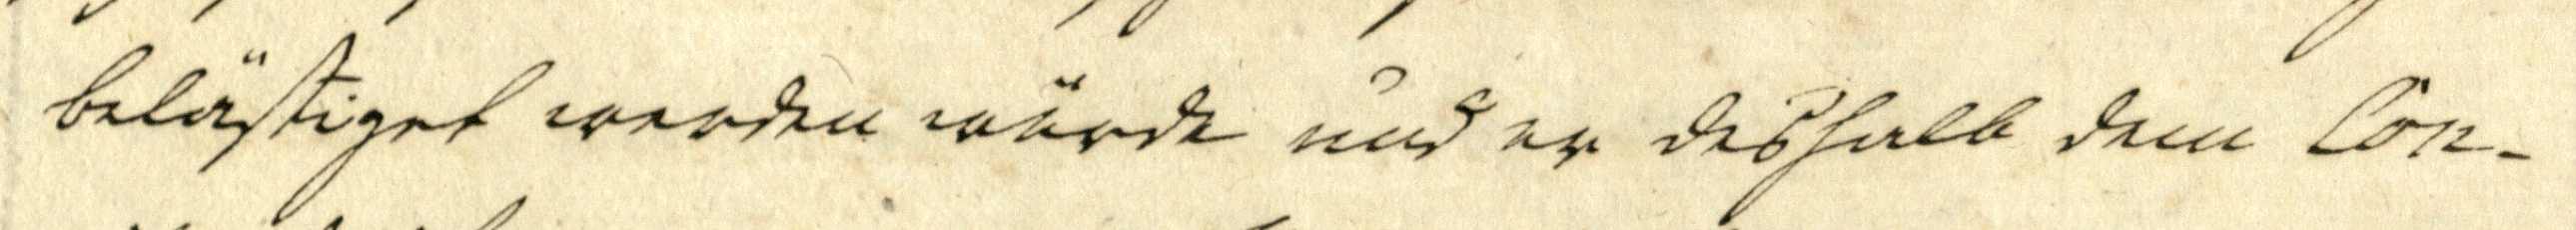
belästiget werden würde und er deshalb dem Con¬
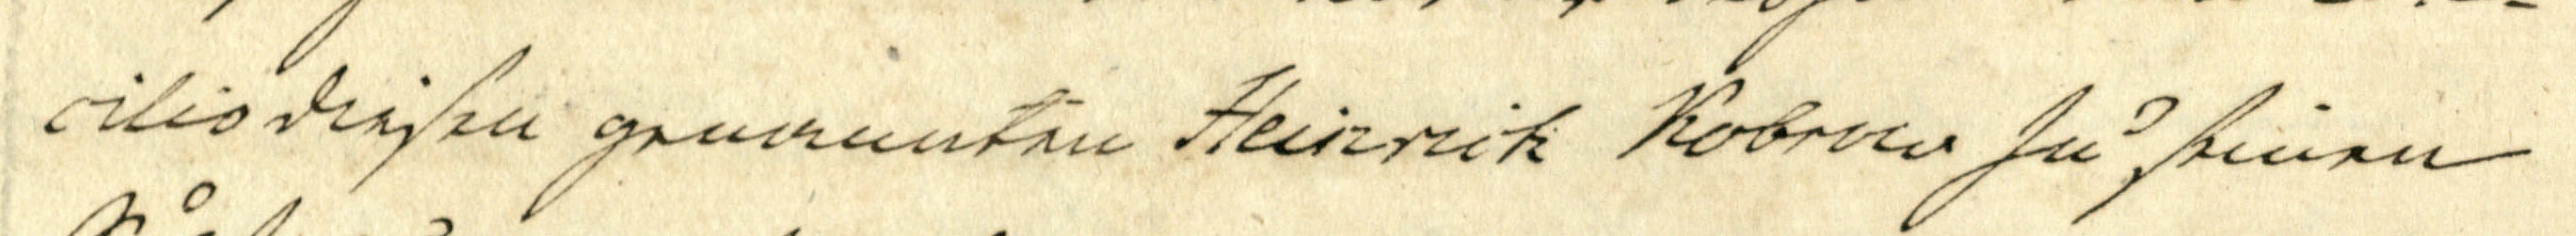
cilio diesen genannten Heinrich Kobrow zu seinen
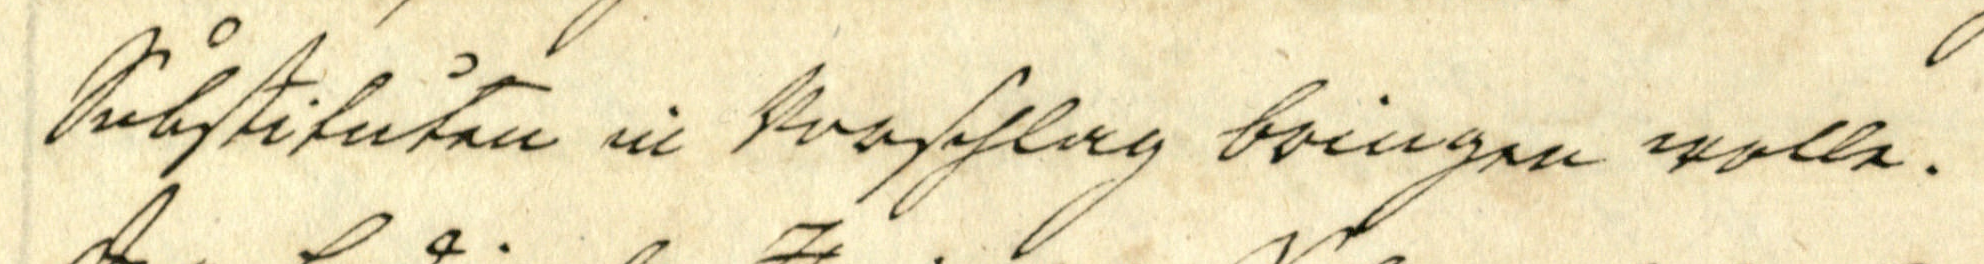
Substituten in Vorschlag bringen wolle.
